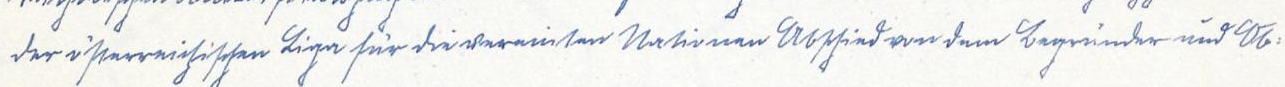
der österreichischen Liga für die Vereinten Nationen Abschied von dem Begründer und Ob-
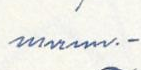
mann.
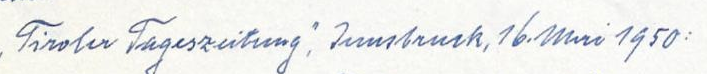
„Tiroler Tageszeitung“, Innsbruck, 16. Mai 1950:
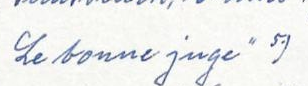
„Le bonne juge“ 5)
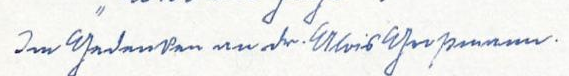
Im Gedenken an Dr. Alois Großmann
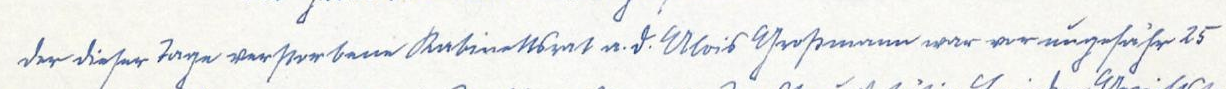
Der dieser Tage verstorbene Kabinettsrat a. D. Dr. Alois Großmann war vor ungefähr 25
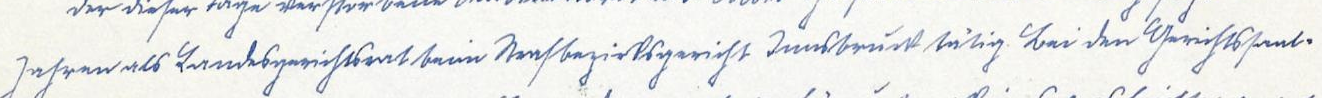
Jahren als Landesgerichtsat beim Strafbezirksgericht Innsbruck tätig. Bei den Gerichtssaal-
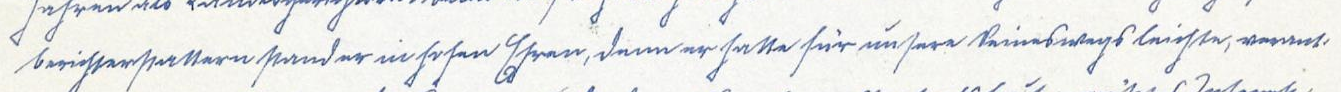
berichterstattern stand er in hohen Ehren, denn hatte für unsere keineswegs leichte, verant-
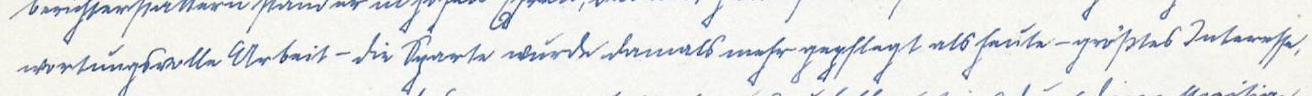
wortungsvolle Arbeit-die Sparte wurde damals mehr gepflegt als heute- größtes Interesse,
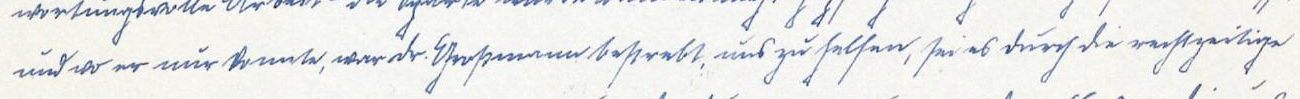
und wo er nur konnte, war Dr. Großmann bestrebt, uns zu helfen, sei es durch die rechtzeitige
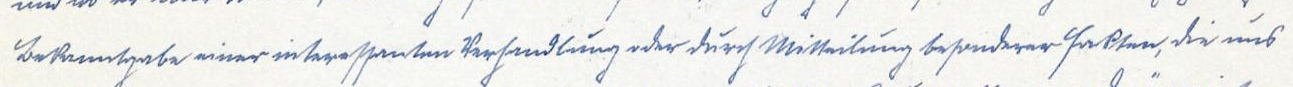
Bekanntgabe einer interessanten Verhandlung oder durch Mitteilung besonderer Fakten, die uns
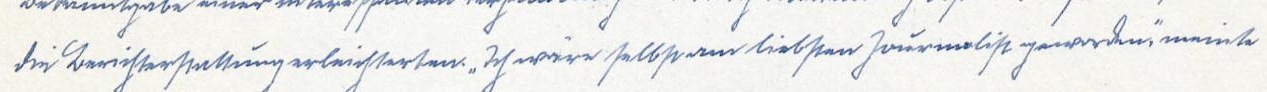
die Berichterstattung erleichterten. „Ich wäre selbst am liebsten Journalist geworden“, meinte
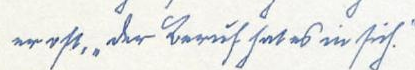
er oft, „der Beruf hat es in sich.“
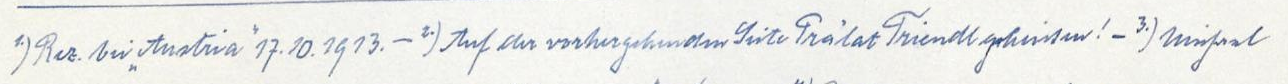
1) Rez. bei Austria 17.10.1913. – 2) Auf der vorhergehenden Seite Prälat Triendl geheißen! – 3) Michael
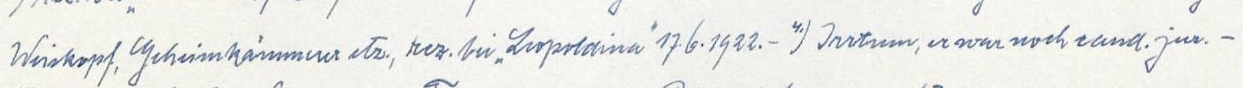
Weiskopf, Geheimkämmerer etc., rez. bei „Leopoldina“ 17.6.1922.- 4) Irrtum, e rwar noch cand. iur.-
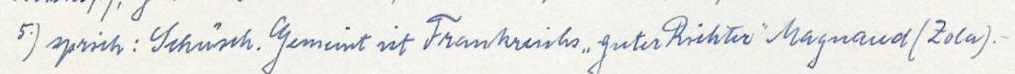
5) Sprich: Schüsch. Gemeint ist Frankreichs „guter Richter“ Magnaud (Zola)
